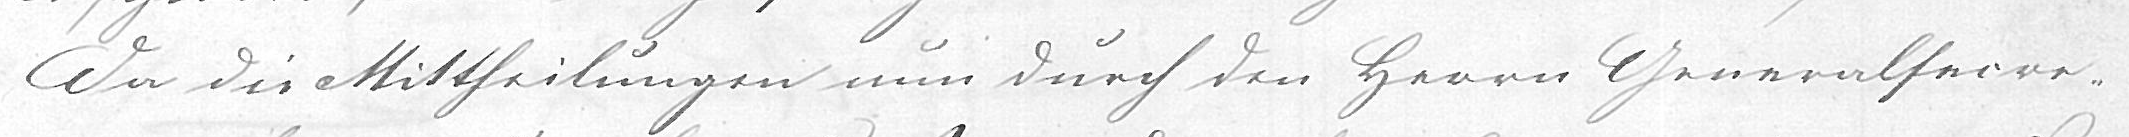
Da die Mittheilungen nun durch den Herrn Generalsecre-
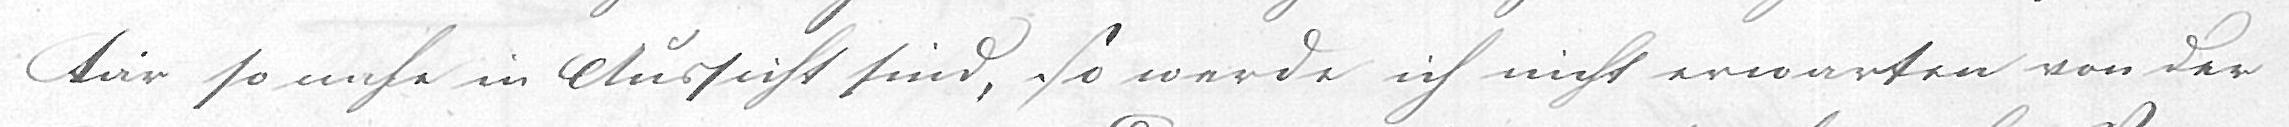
tär so mehr in Aussicht sind, so werde ich nicht erwarten von der
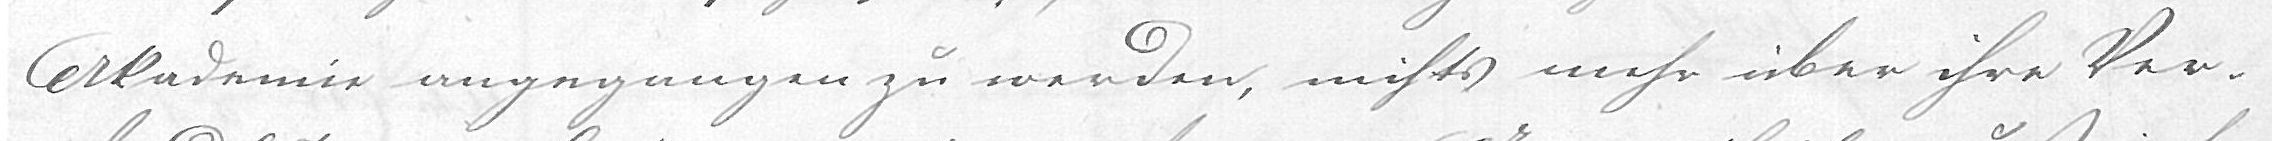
Akademie angegangen zu werden, nichts mehr über ihre Ver-
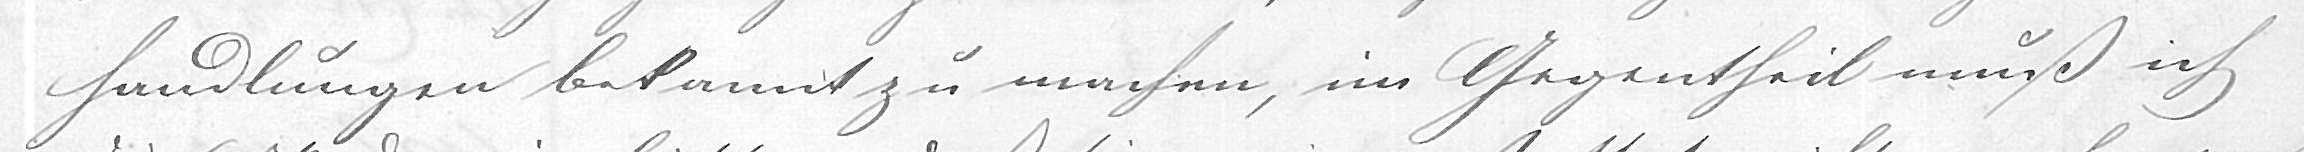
handlungen bekannt zu machen, im Gegentheil muß ich
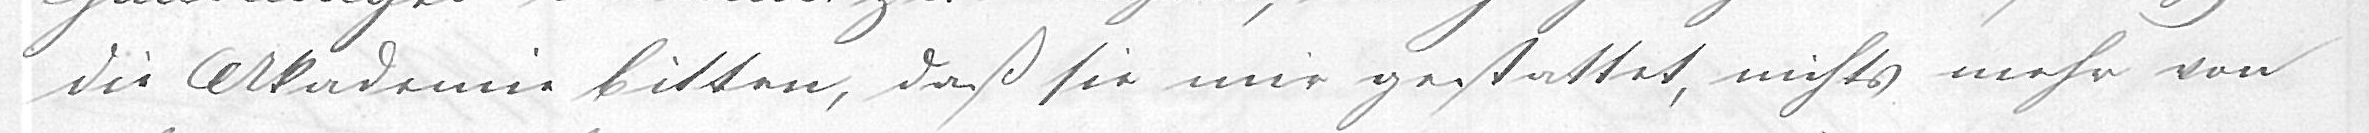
die Akademie bitten, daß sie mir gestattet, nichts mehr von
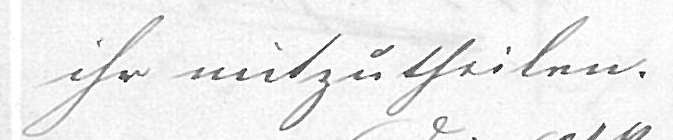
ihr mitzutheilen.
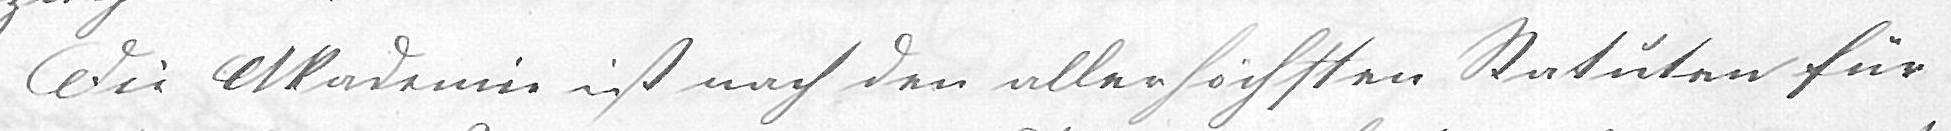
Die Akademie ist nach dem allerhöchsten Statuten für
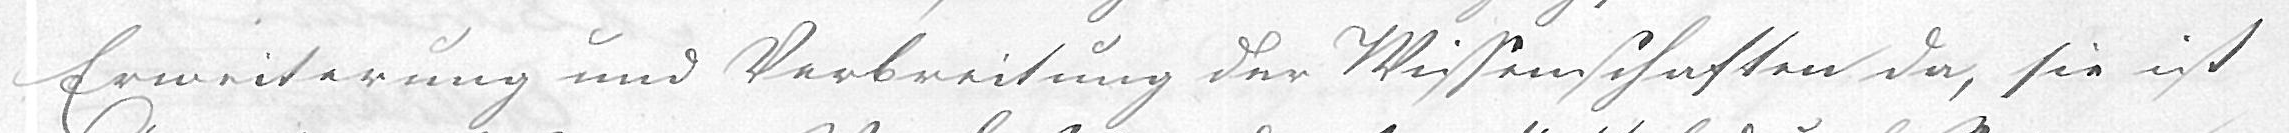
Erweiterung und Verbreitung der Wissenschaften da, sie ist
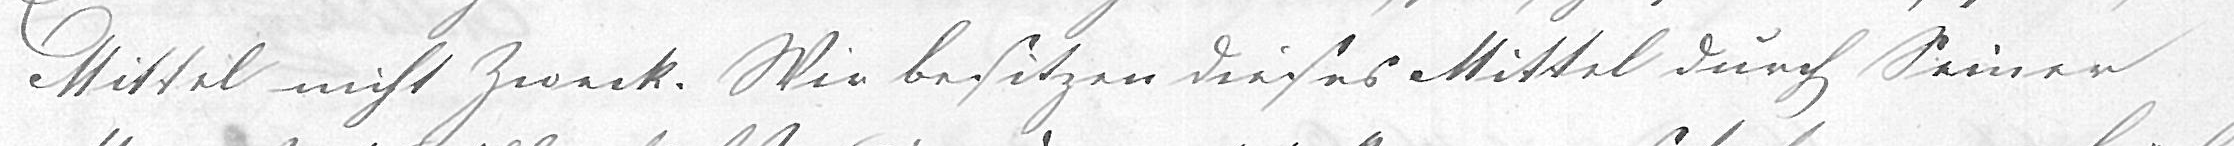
Mittel nicht Zweck. Wir besitzen dieses Mittel durch Seiner
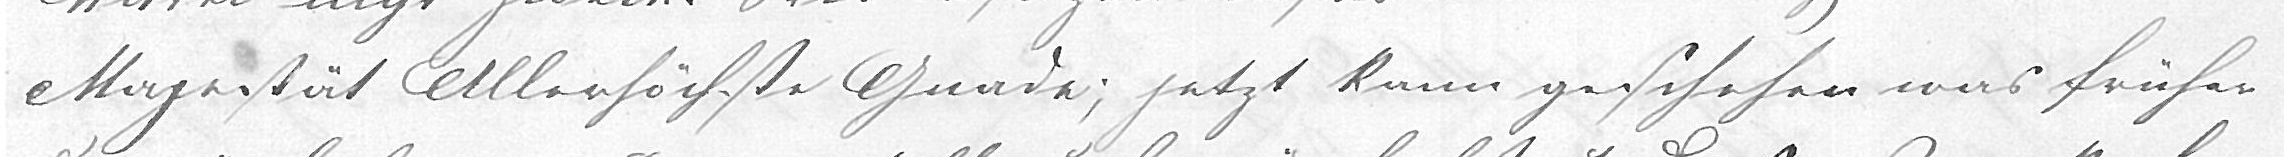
Majestät Allerhöchste Gnade; jetzt kann geschehen was früher
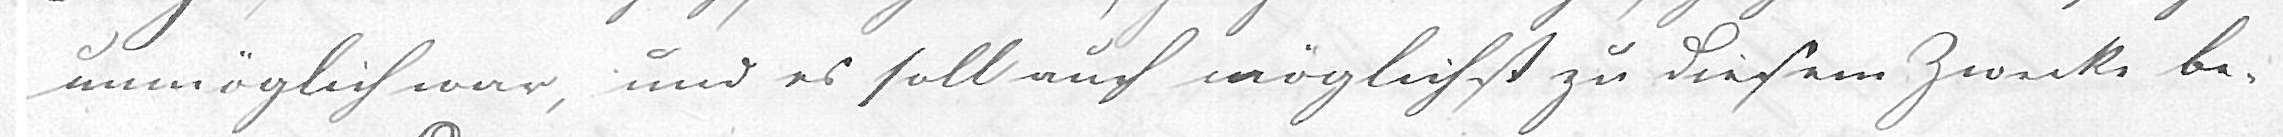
unmöglich war, und es soll auch möglichst zu diesem Zwecke be-
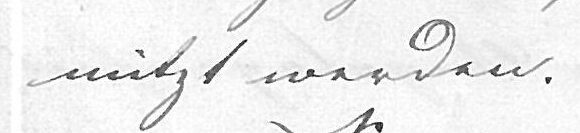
nutzt werden.
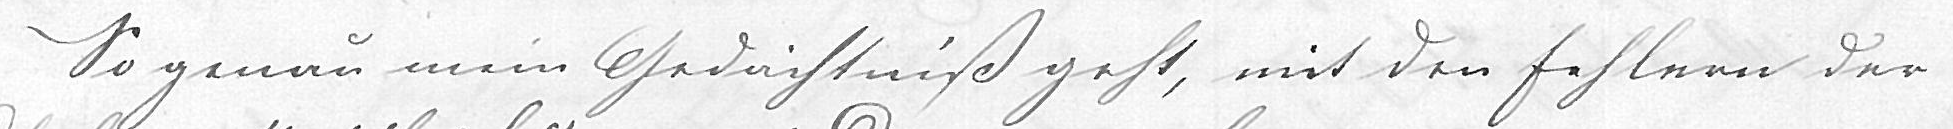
So genau mein Gedächtniß geht, mit den Fehlern der
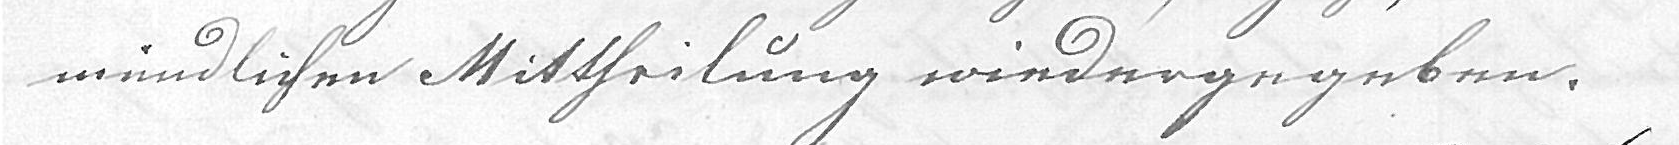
mündlichen Mittheilung wiedergegeben.
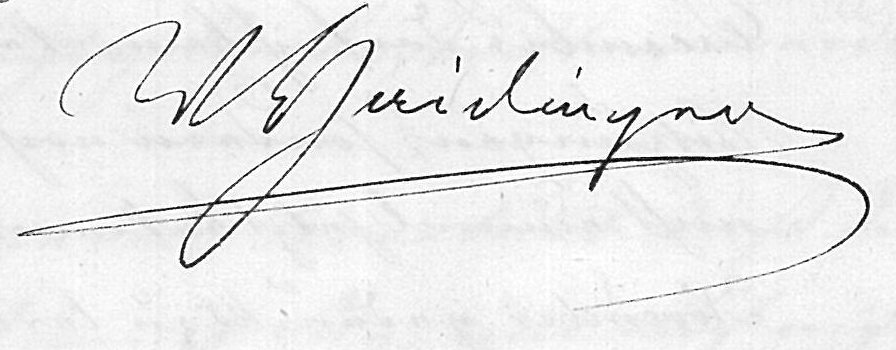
W Haidinger
